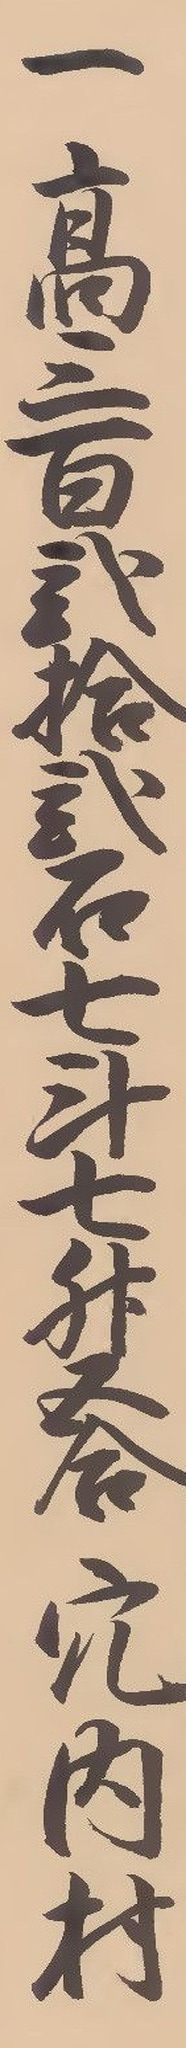一髙三百弐拾弐石七斗七升五合穴内村

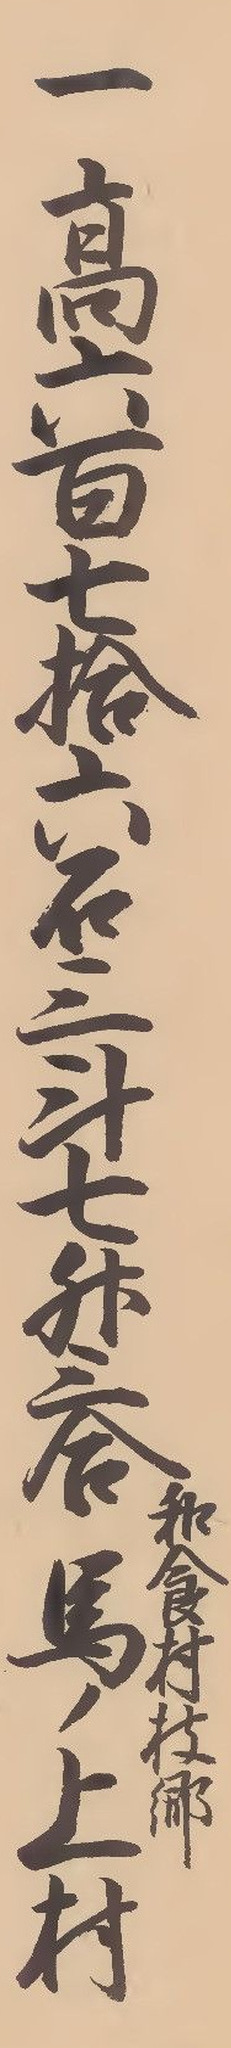一髙六百七拾六石三斗七升三合馬ノ上村
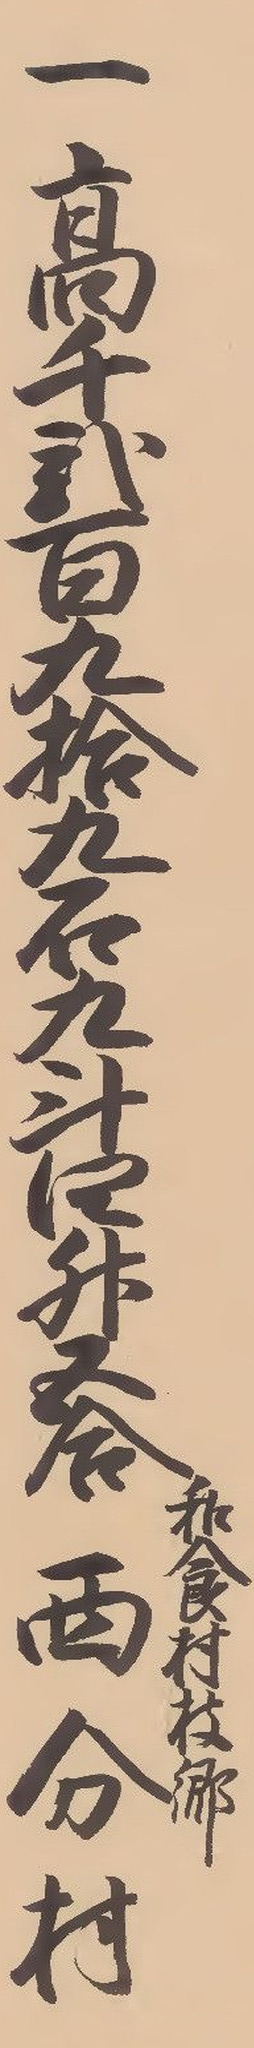一髙千弐百九拾九石九斗四升五合西分村
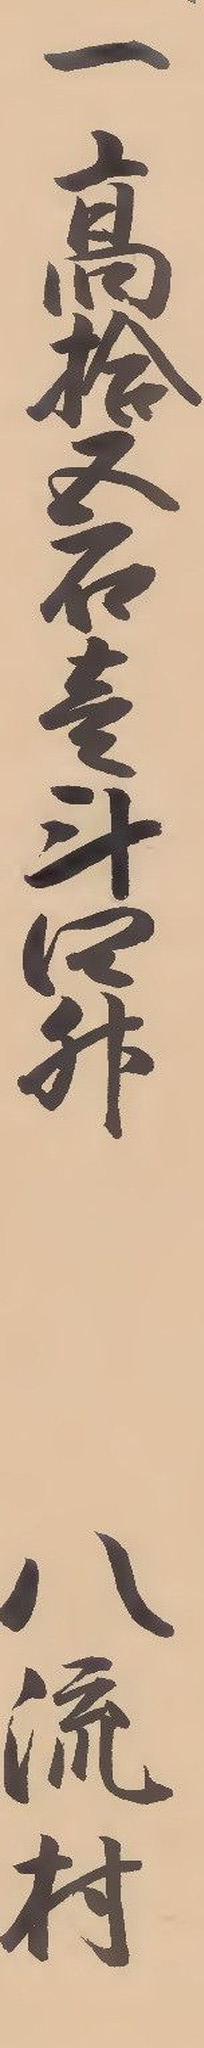一髙拾五石壱斗四升八流村
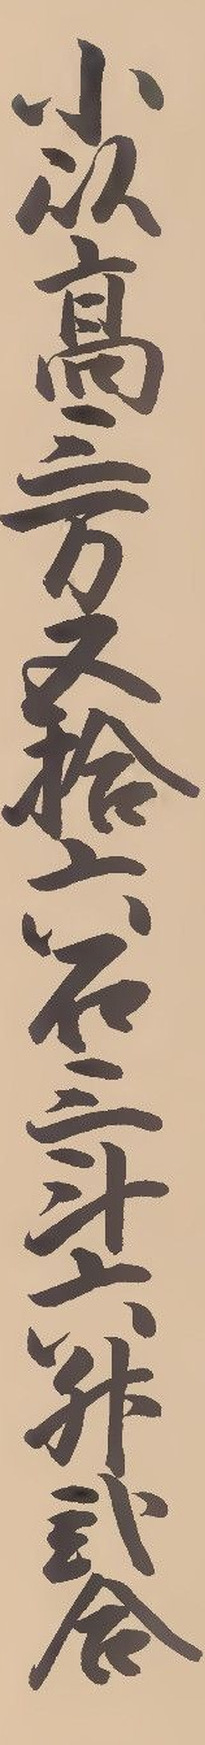小以髙三万五拾六石三斗六升弐合

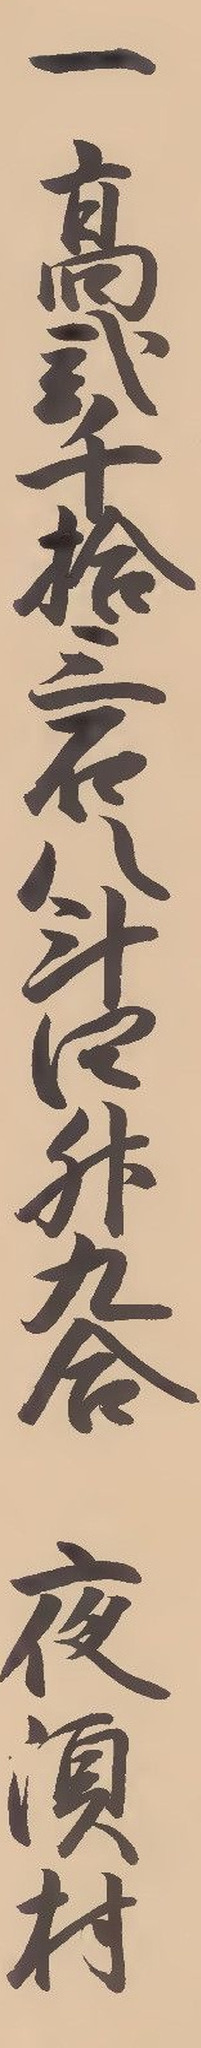一髙弐千拾三石八斗四升九合夜須村
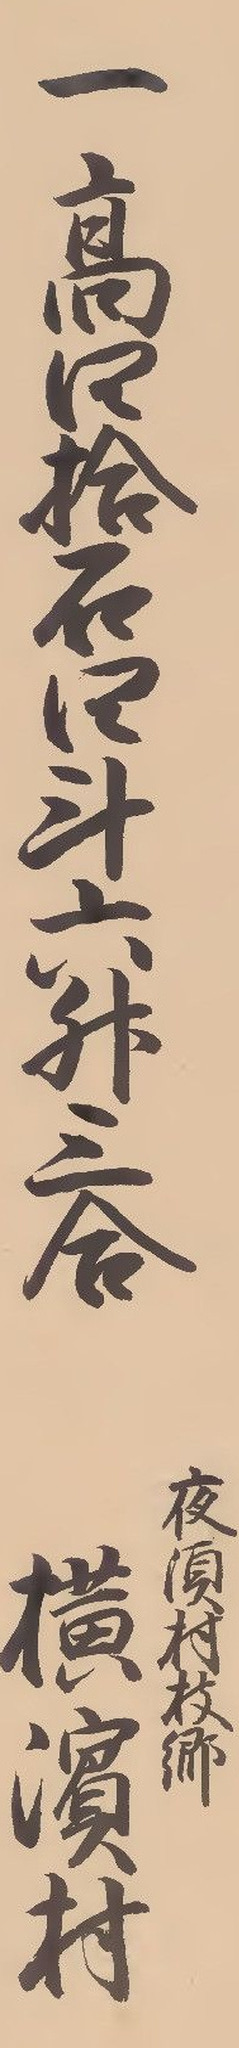一髙四拾石四斗六升三合横濱村
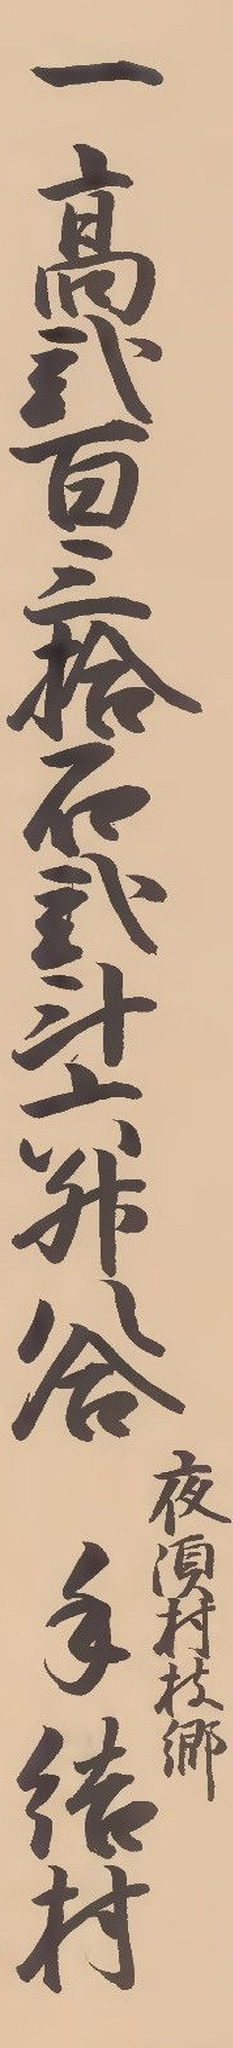一髙弐百三拾石弐斗六升八合手結村
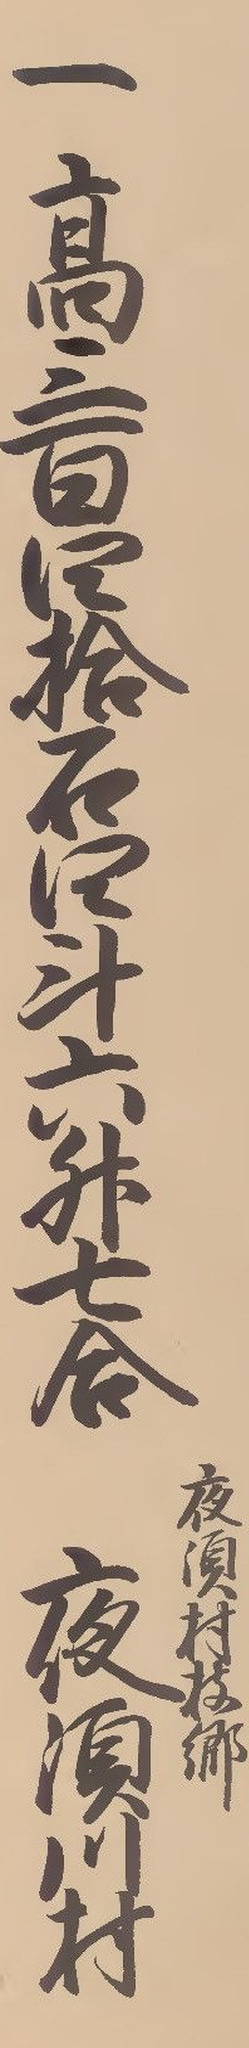一髙三百四拾石四斗六升七合夜須川村
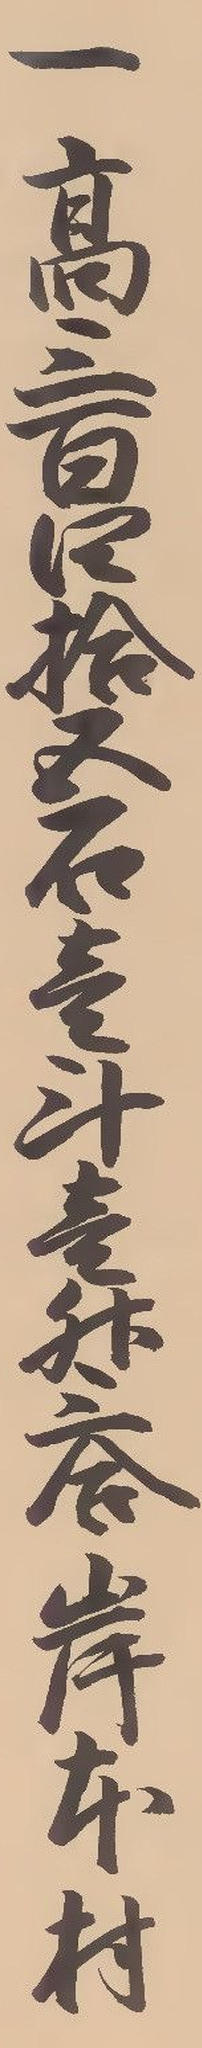一髙三百四拾五石壱斗壱升三合岸元村
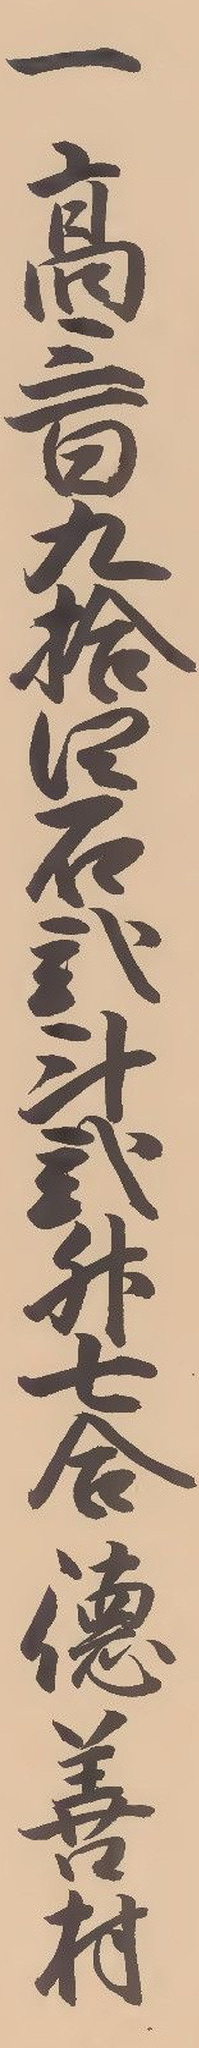一髙三百九拾四石弐斗弐升七合徳善村
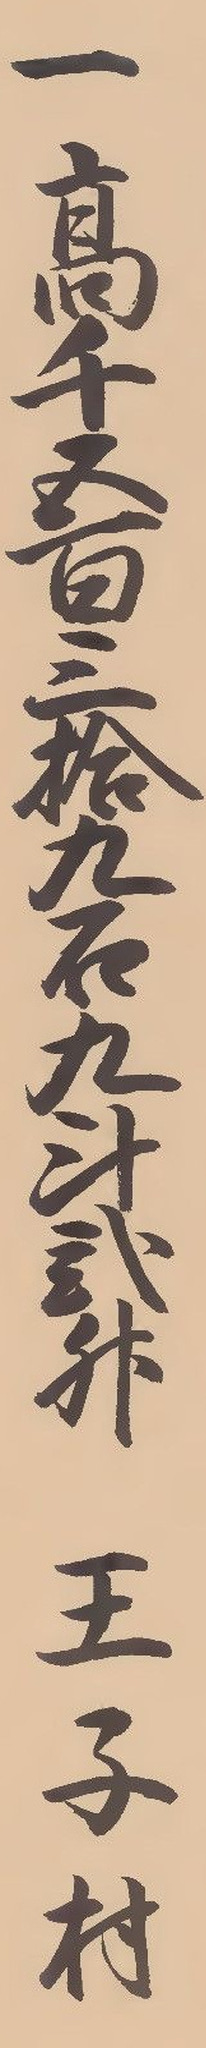一髙千五百三拾九石九斗弐升王子村

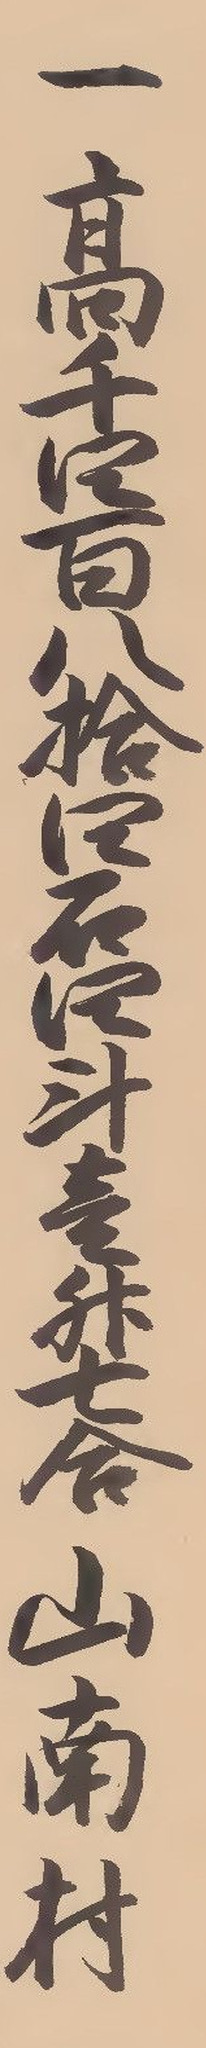一髙千四百八拾四石四斗壱升七合山南村
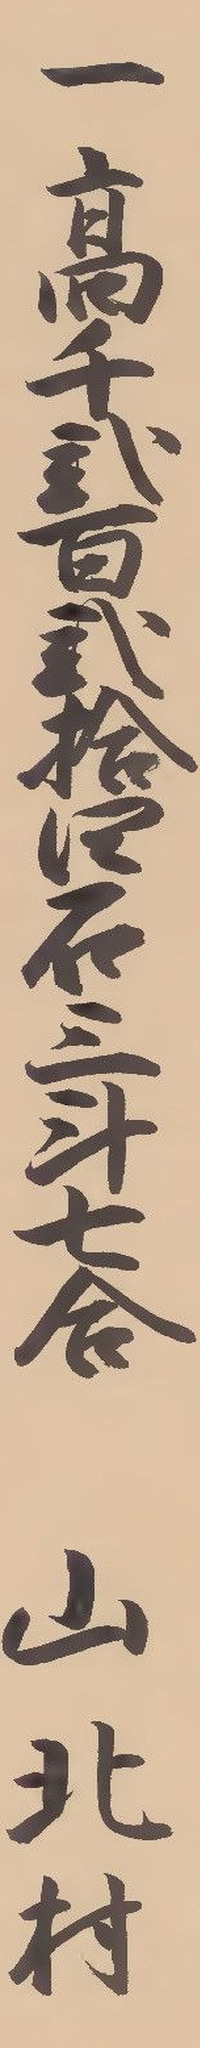一髙千弐百弐拾四石三斗七合山北村
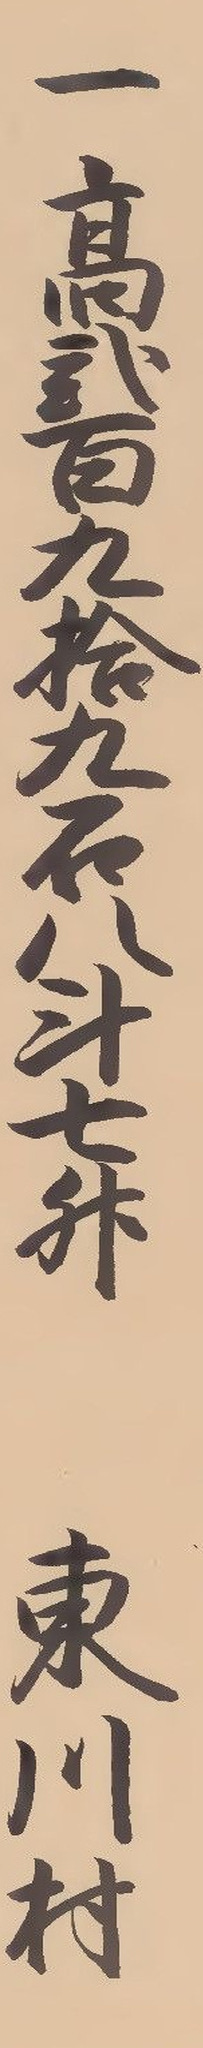一髙弐百九拾九石八斗七升東川村
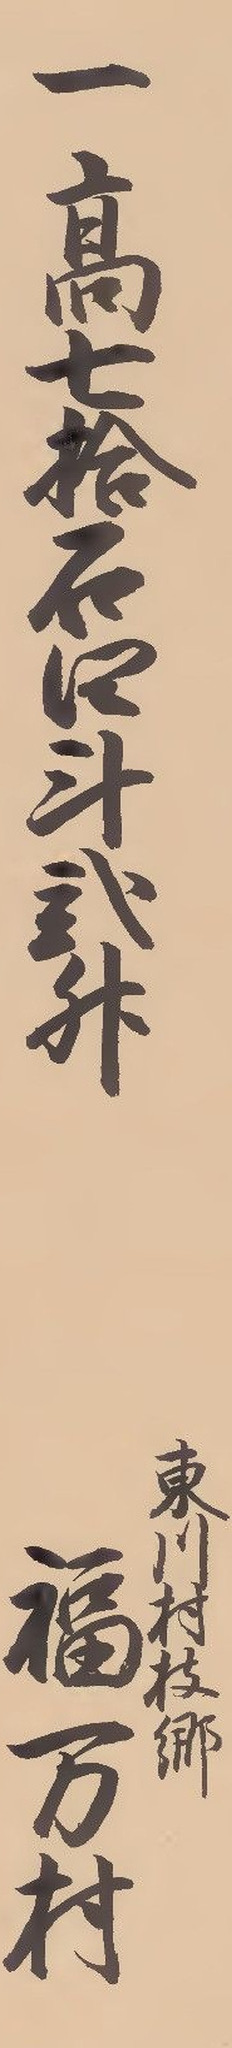一髙七拾石四斗弐升福万村
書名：土佐国郷帳
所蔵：国立公文書館 National Archives of Japan
